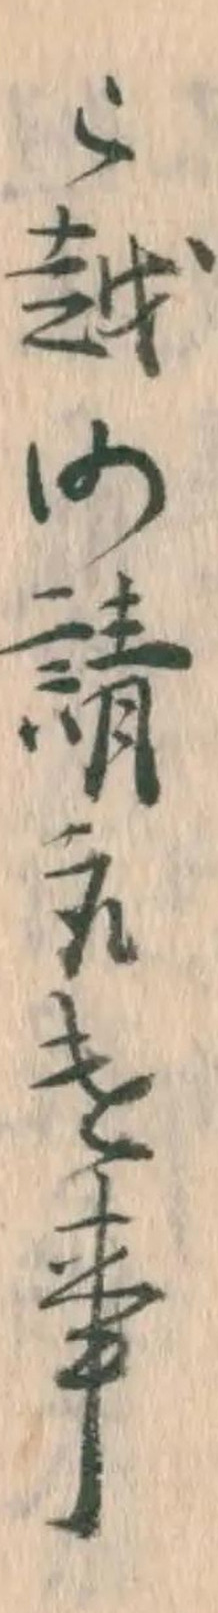被越仍請取遣事
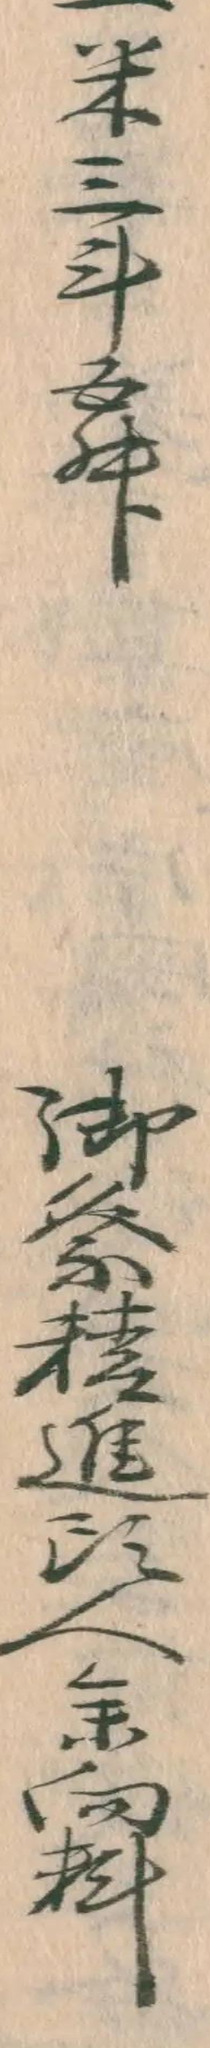一米三斗五升御祭精進頭人参向料
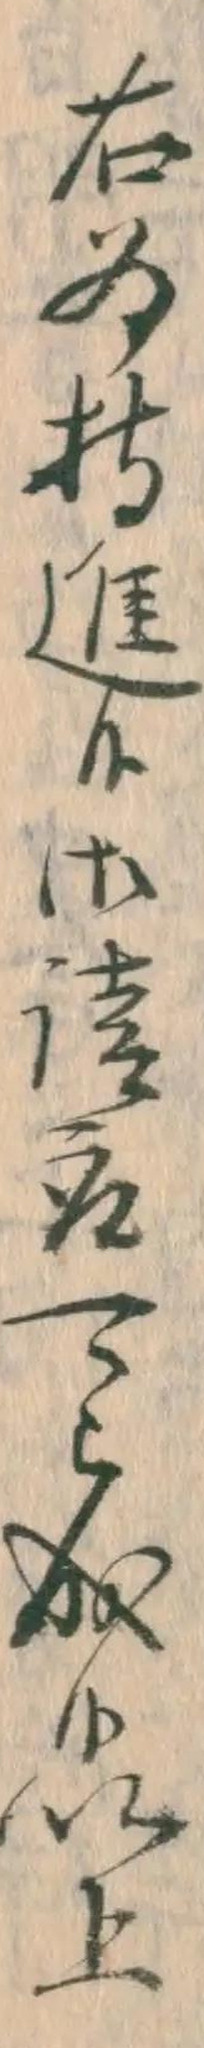右為持進候御請取可被成候以上
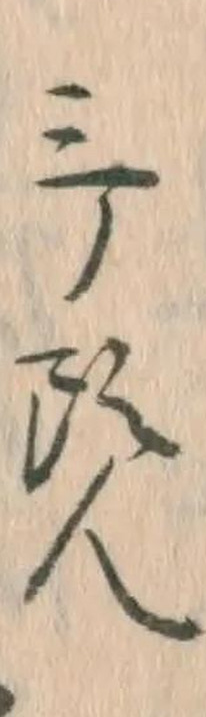三ノ頭人
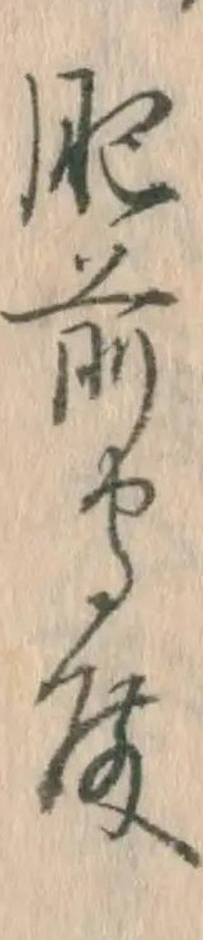肥前守殿
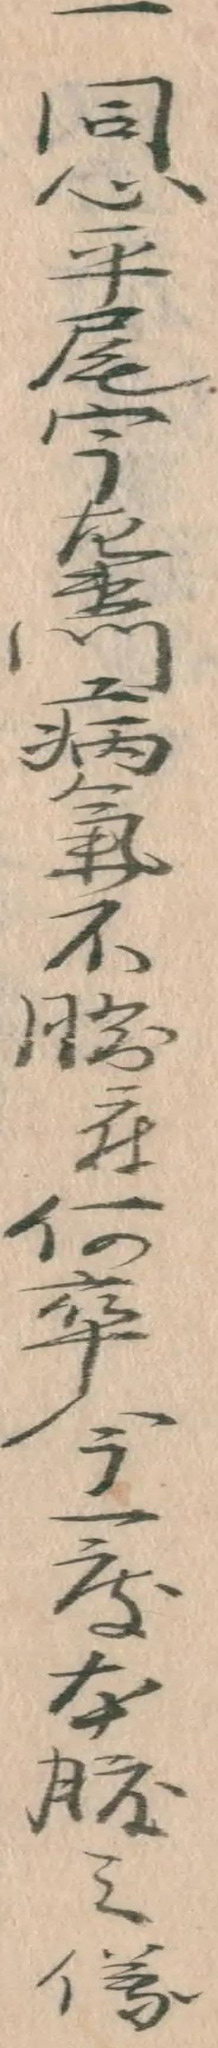一同心平尾宇左衛門病氣不勝に付何卒今一度本腹之儀
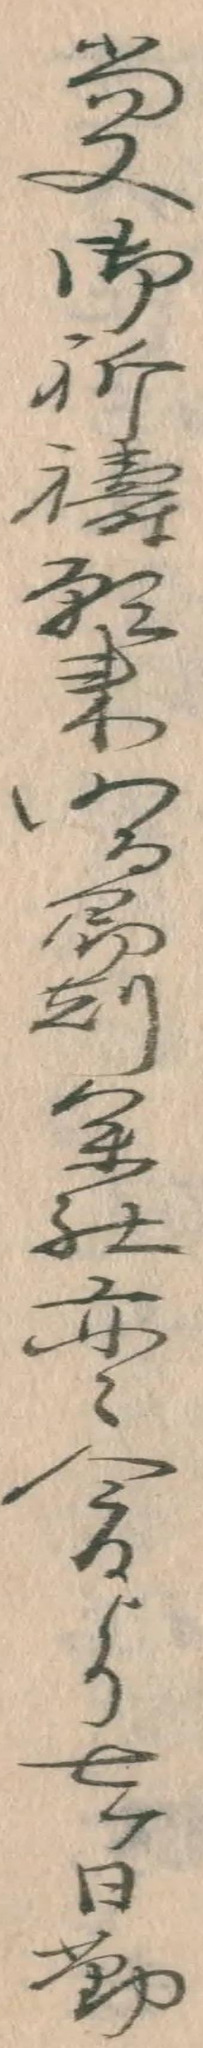尚又御祈祷願来仍而即刻参社亦々今日より七ケ日勤
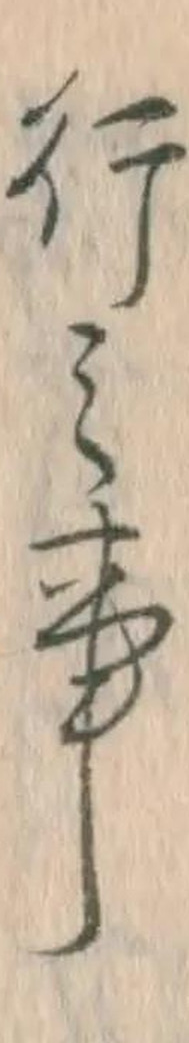行之事
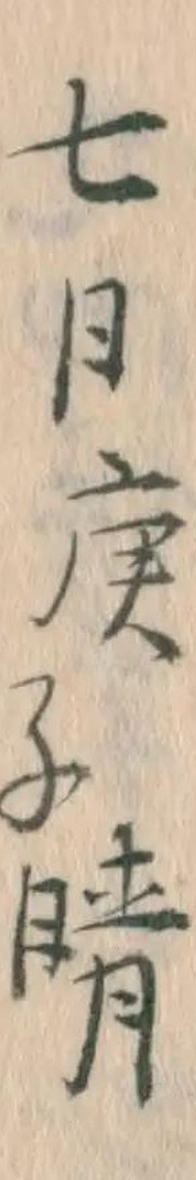七日庚子晴
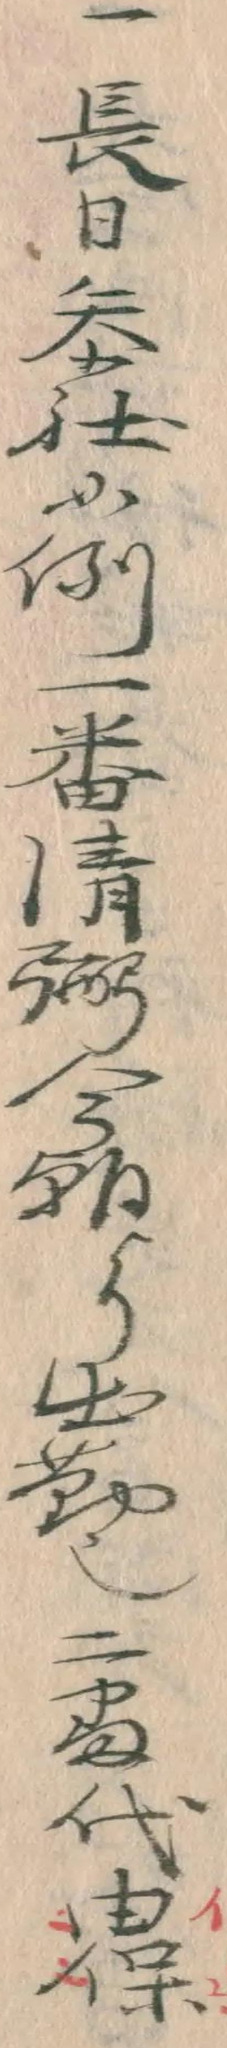一長日参社如例一番清弼今朝より出勤也二番代由保
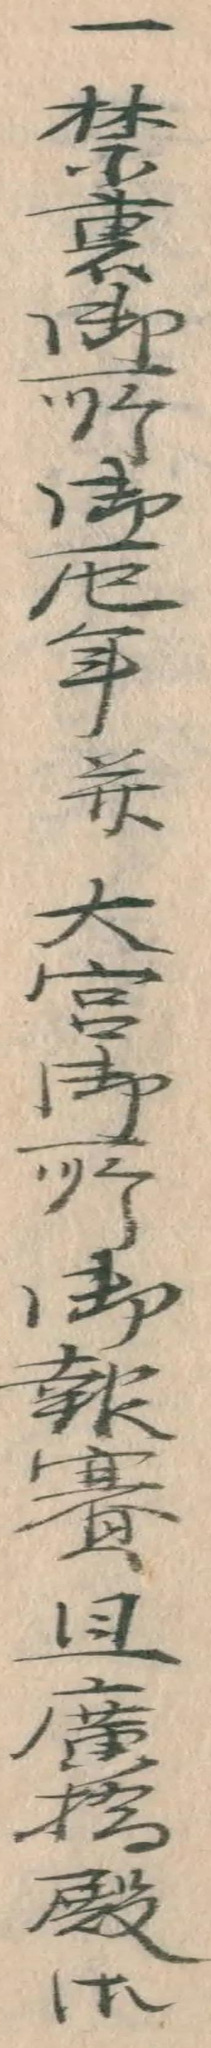一禁裏御所御厄年并大宮御処御報賽且廣橋殿御
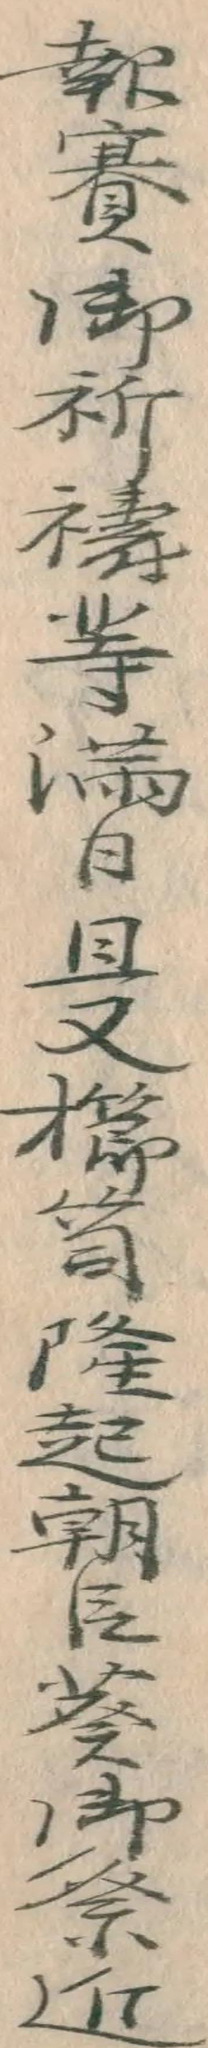報賽御祈祷等満日且又櫛笥隆起朝臣葵御祭近
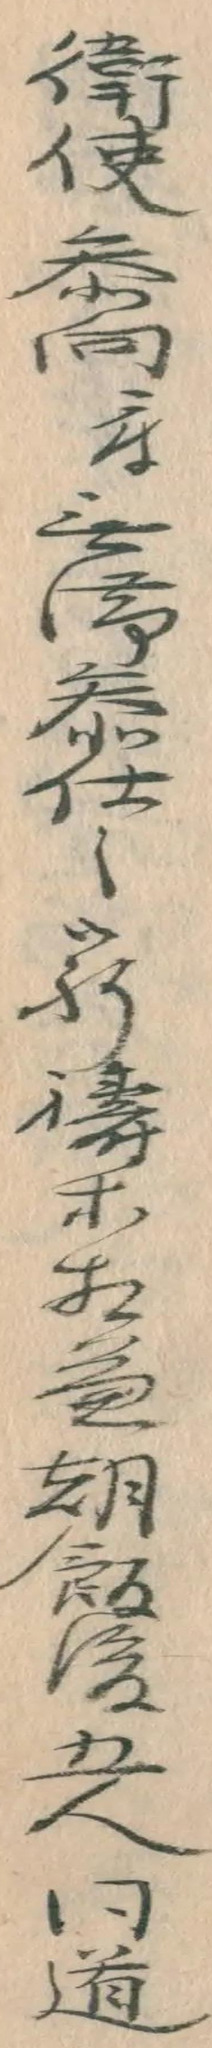衛使参向ニ付無滞参仕之御祈祷等相兼朝飯後五人同道

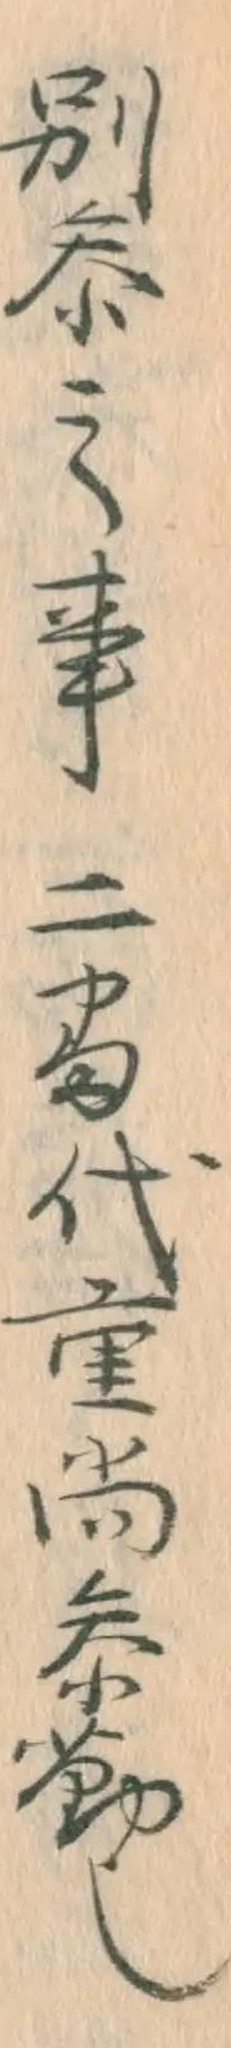別参之事二番代重尚参勤也
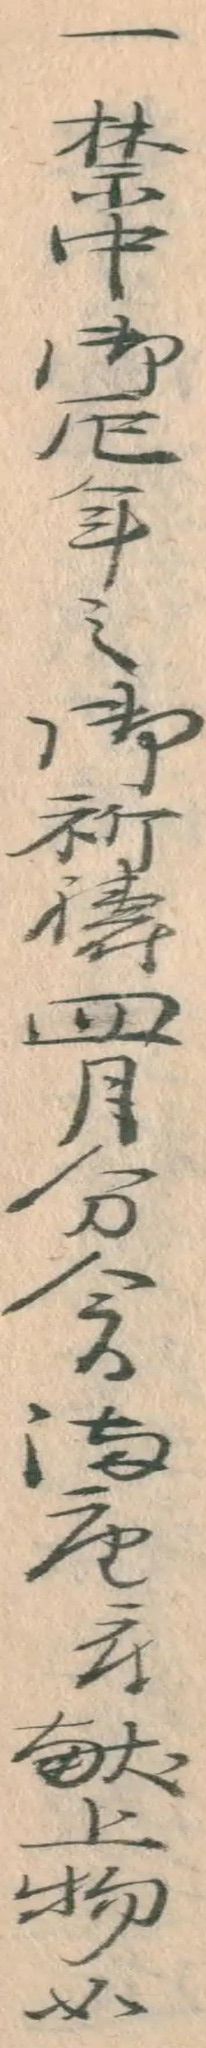一禁中御厄年之御祈祷四月分今日満座ニ付献上物如
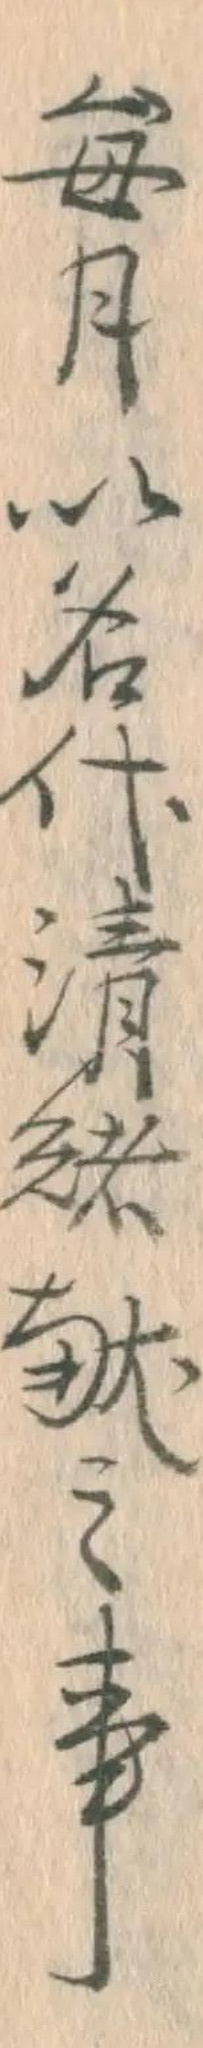毎月以名代清緒献之事
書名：賀茂社記録. 第73冊
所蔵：国立国会図書館 National Diet Library, JAPAN
